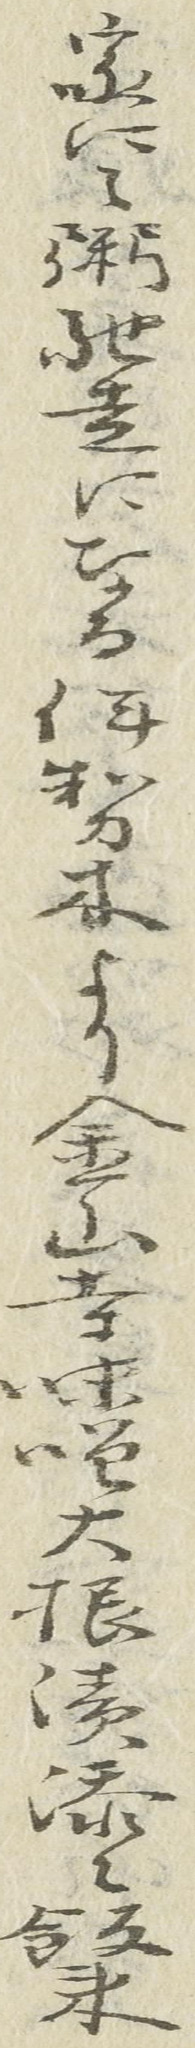家にて粥馳走になる伊勢木より金山寺味噌大根漬添て飯来
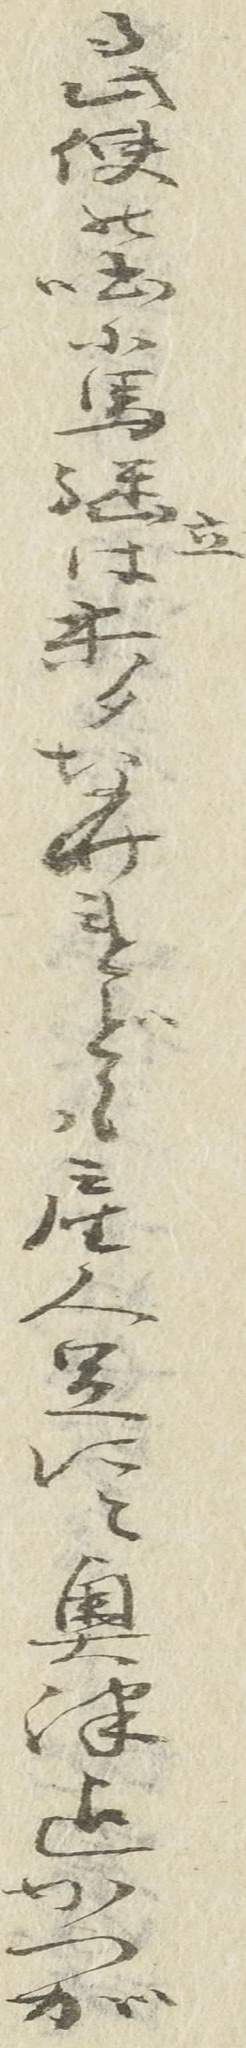る此使の咄に馬継立は未たなけれども雇人足にて奥津迄かつが
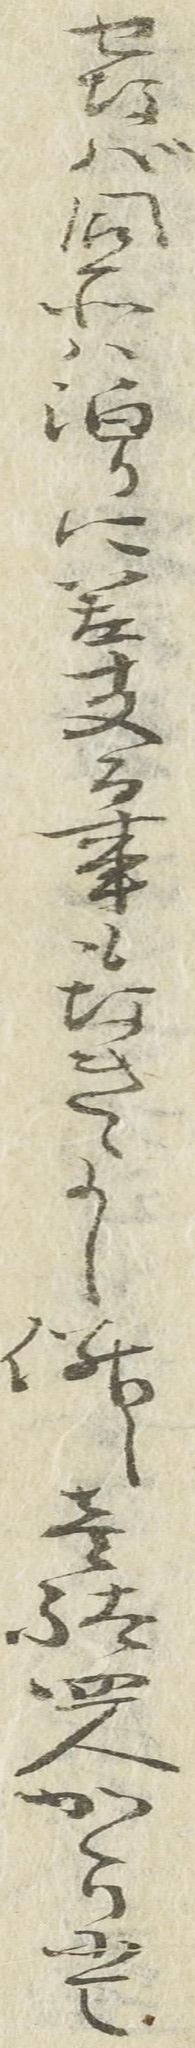せなば同所は泊りに差支る事もなきよし併し壱駄四人かゝりにて
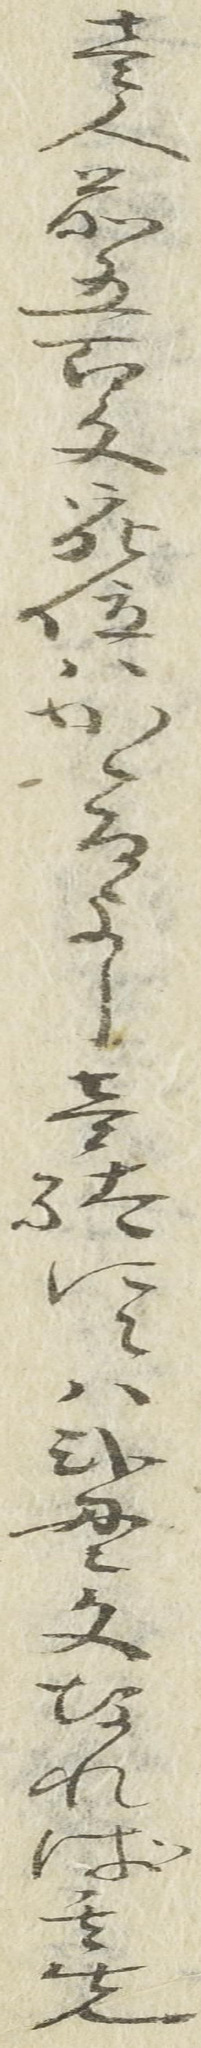壱人前五百文宛位はかゝるよし壱駄にては弐貫文なれば其先
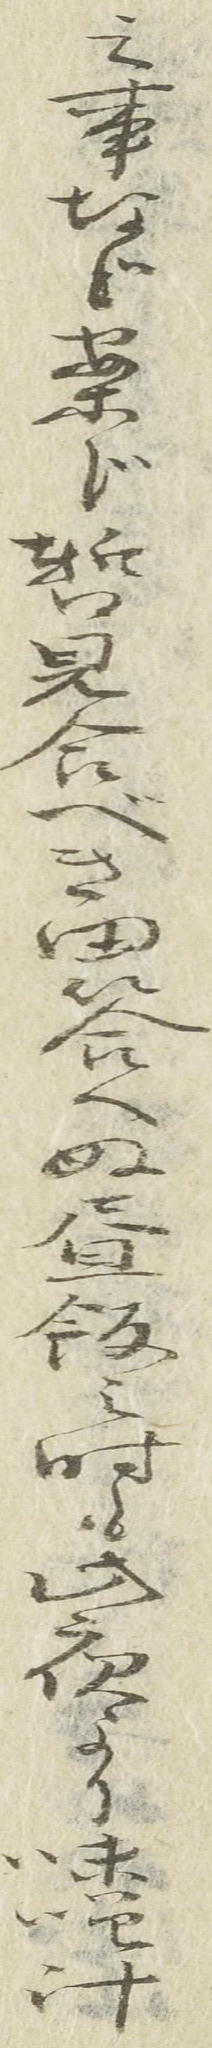之事など案じ暫見合べき田答へぬ昼飯の時も此夜より味噌汁
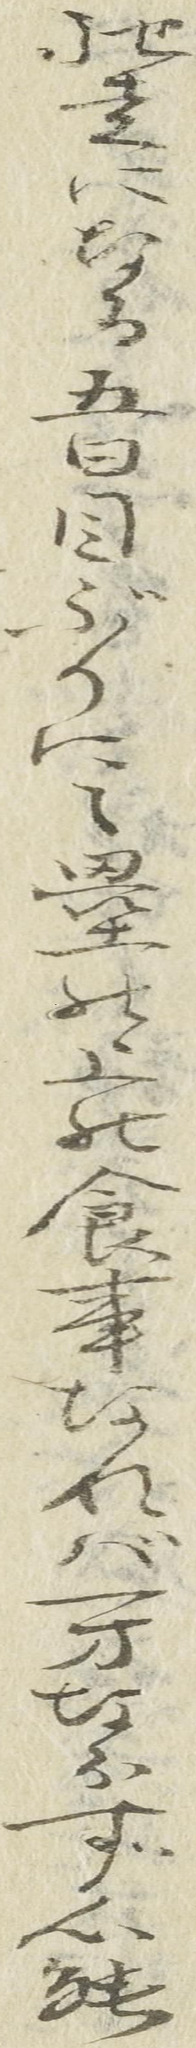馳走になる五日目ぶりにて畳の上の食事なれば一方ならず心能
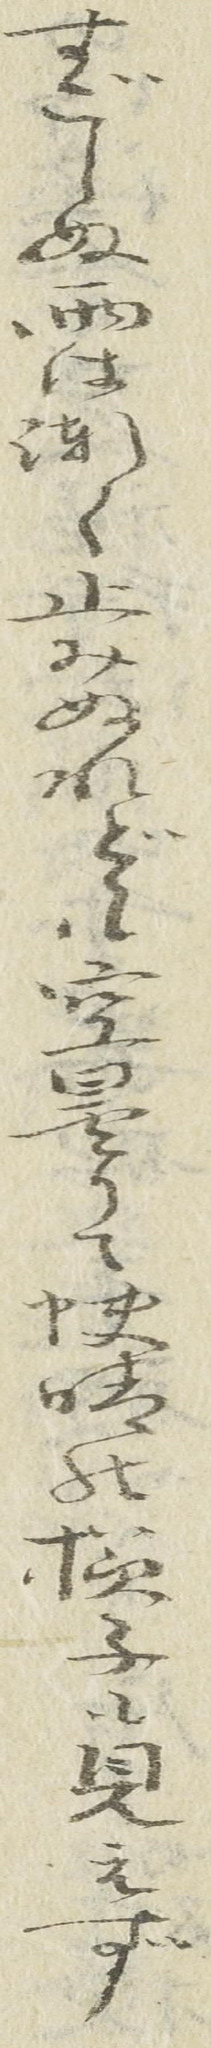すごしぬ雨は漸く止みぬれども空曇りて快晴の様子も見えず
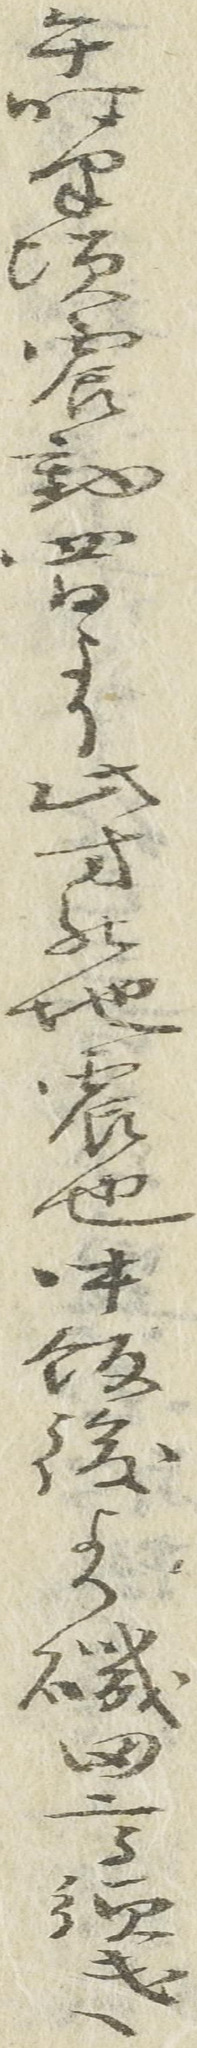午時半頃震動四日より此方の地震也中飯後より磯田高須氏へ
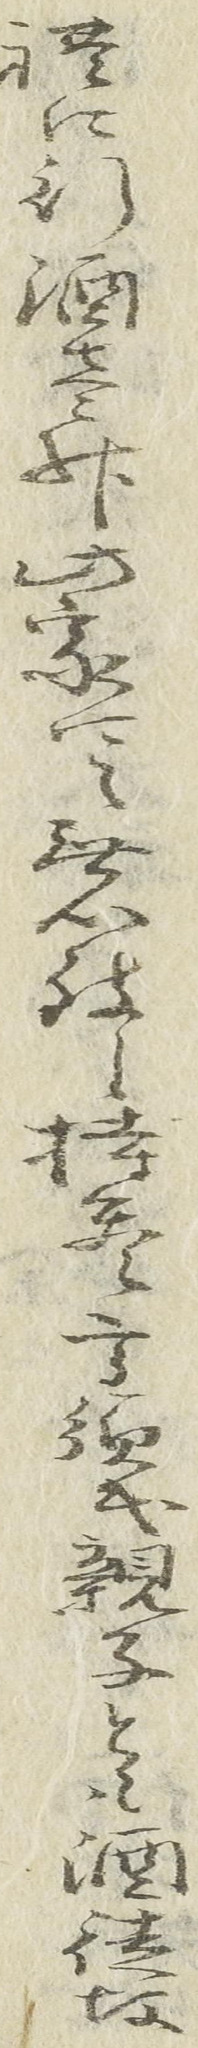礼に行酒壱升此家にて無心致し持参高須氏親子とも酒徒な
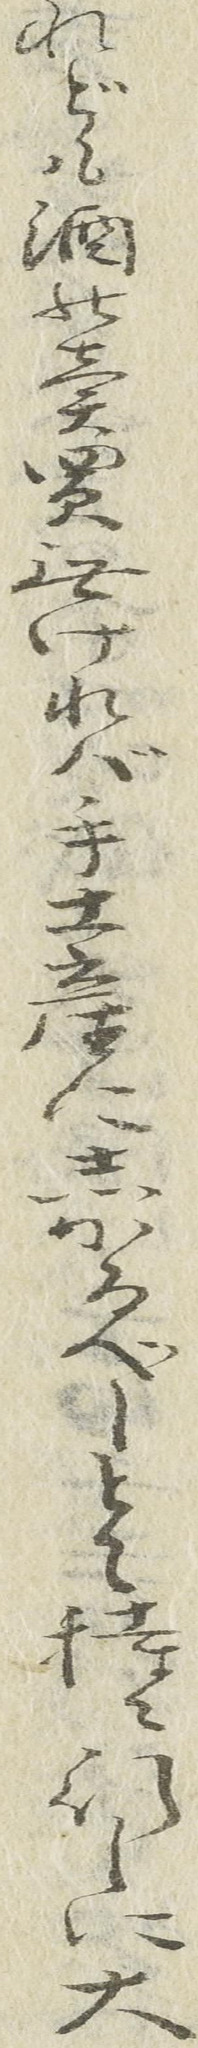れども酒の売買無ければ手土産にしかるべしとて持ニ行しに大
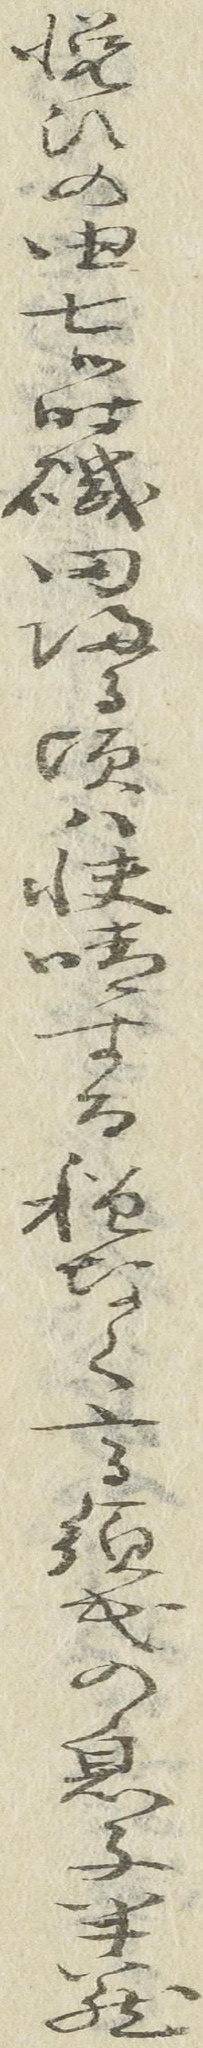悦ひの由七ツ時磯田帰る頃は快晴する程なく高須氏の息子半蔵
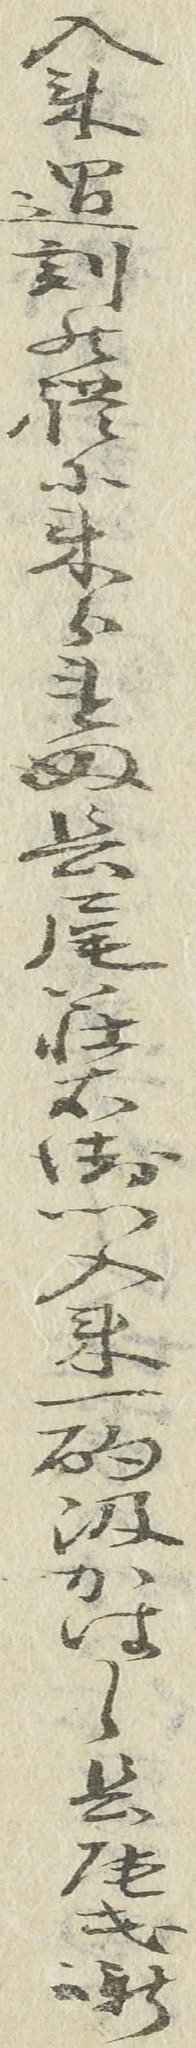入来遅過刻の体に来られぬ長尾荘右衛門入来一酌汲かはし長尾氏噺
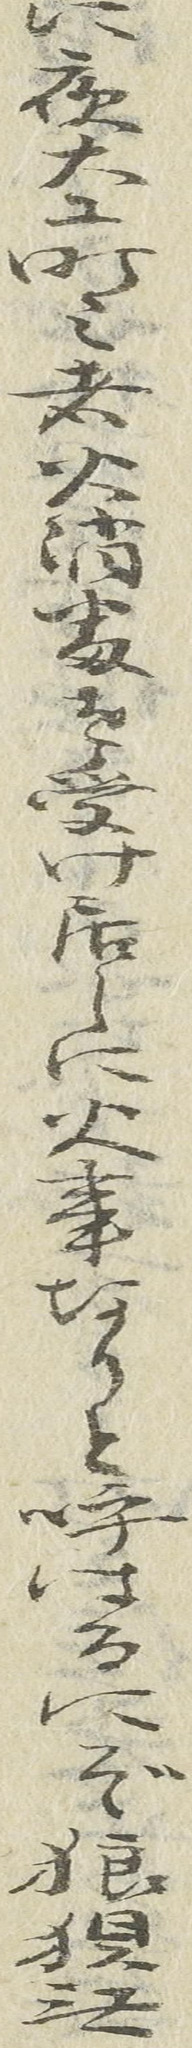に夜大工町之者火消番を受け居しに火事なりと呼はるにぞ狼狽無
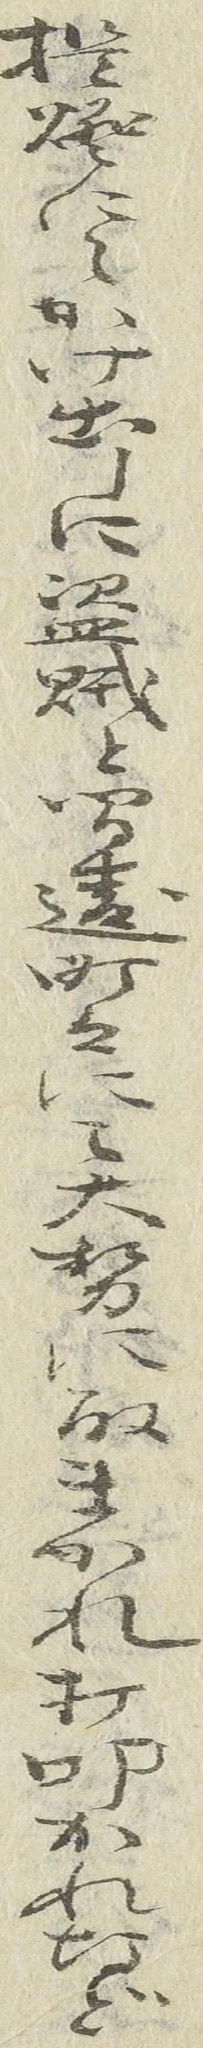提燈にてかけ出しに盗賊と間違町々にて大勢に取まかれ打叩かれなど
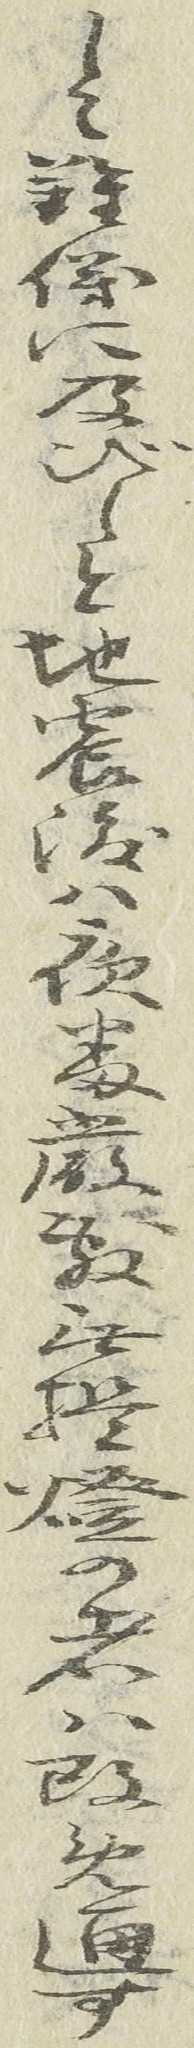して難儀に及びしと地震後は夜番厳敷無提燈の者は改め通す
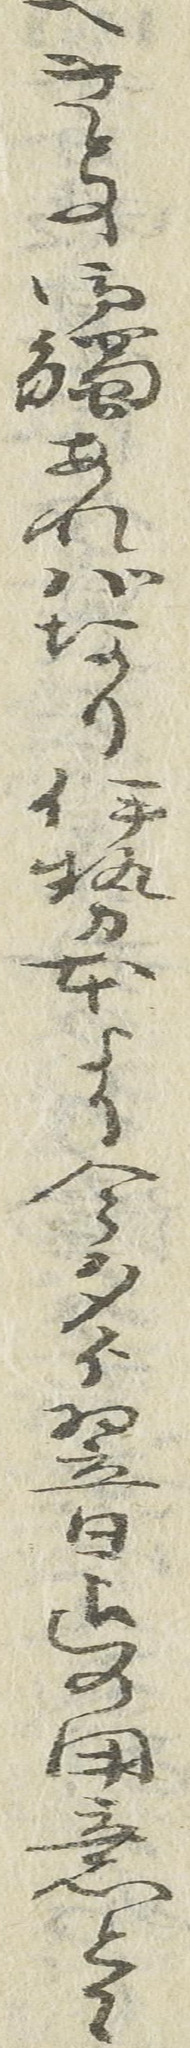へきおとの御触あればなり伊勢本より今夕ゟ翌日迄の用意とて
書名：地震前兆集　全
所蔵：東京大学地震研究所図書室 Earthquake Research Institute Library, The University of Tokyo, JAPAN
